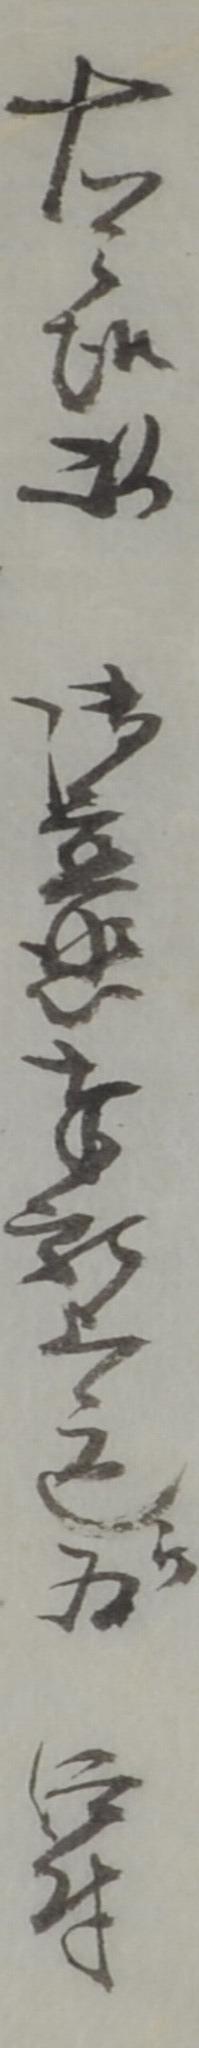右之趣以御慈悲奉願上候通被為仰付
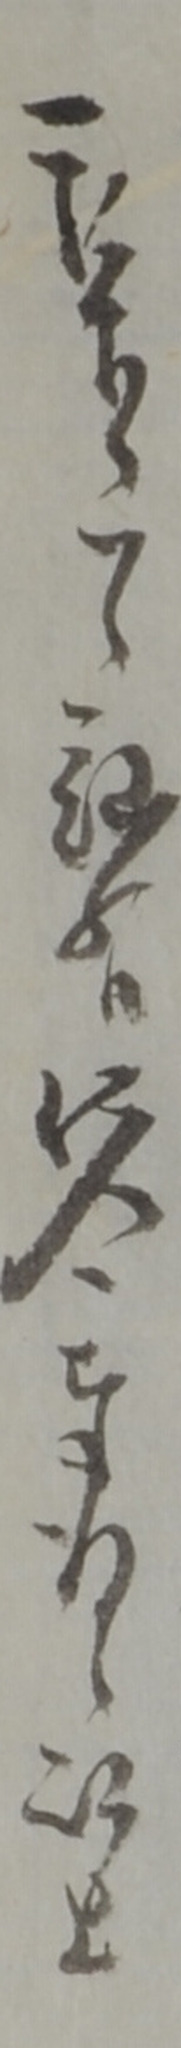被下置候ハヽ難有仕合奉存候以上
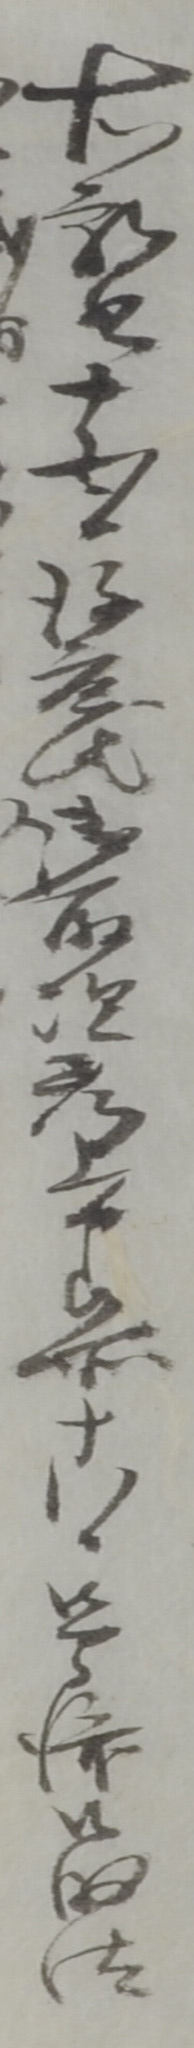右願書十五日後藤氏御取次差上申候所十八日御聞済御沙汰

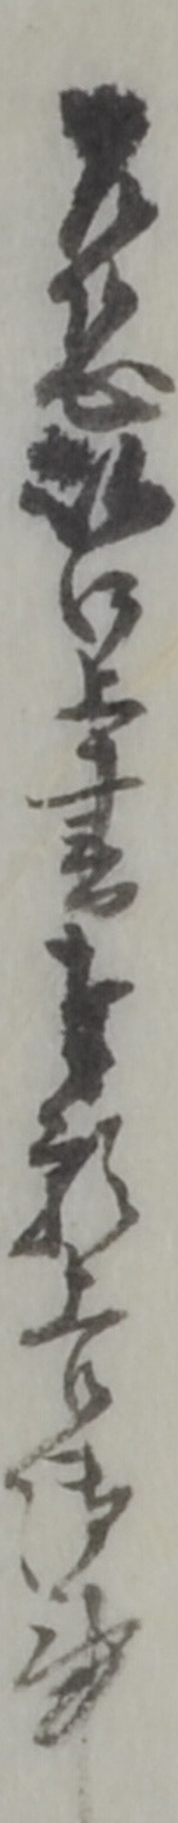乍恐以口上書奉願上候御事
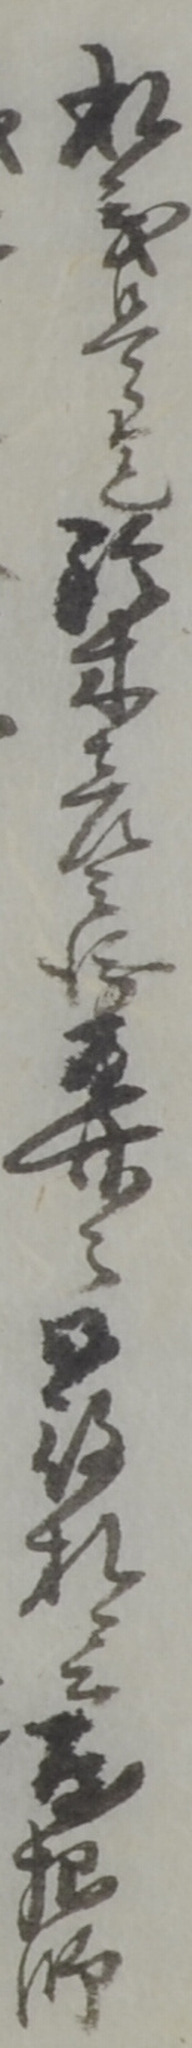私義是迄鈴木彦兵衛厄介之御役札ニ而屋根師
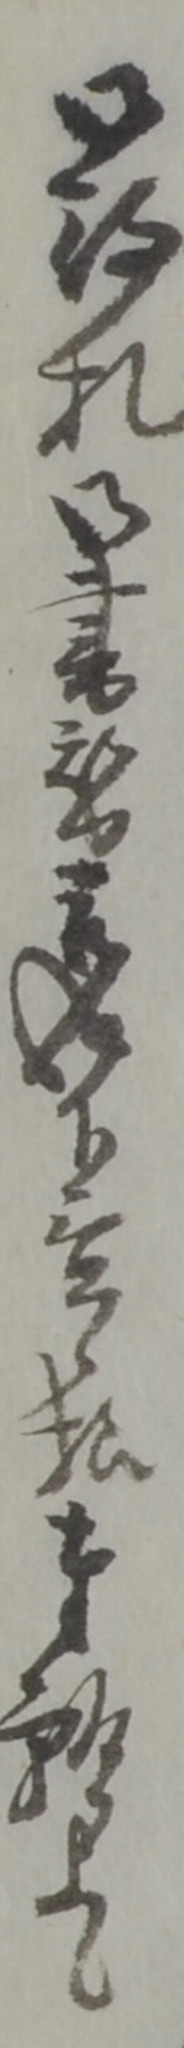御役札御書替被成下置候様奉願上候
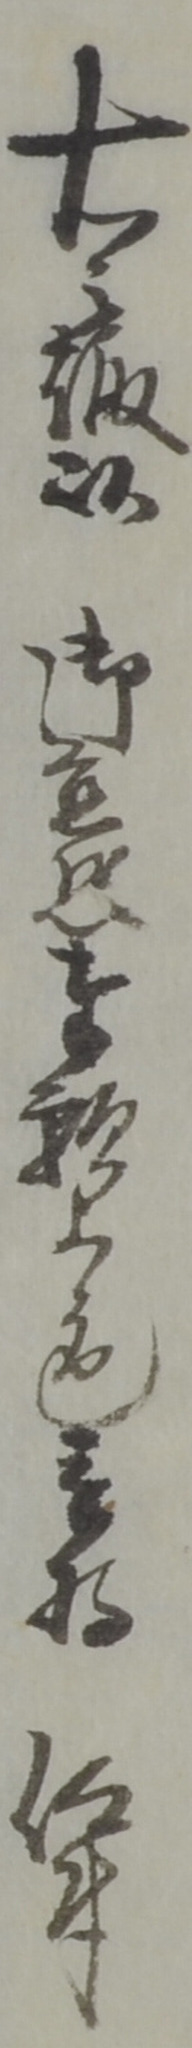右之趣以御慈悲奉願上候通被為仰付
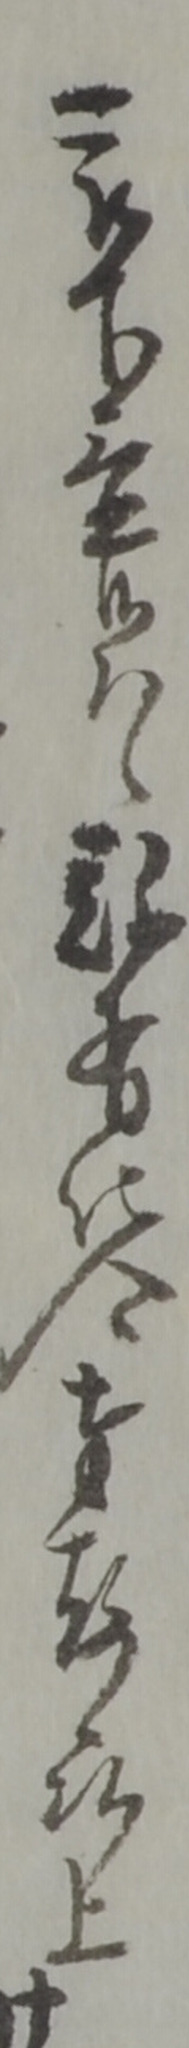被下置候ハヽ難有仕合奉存候以上
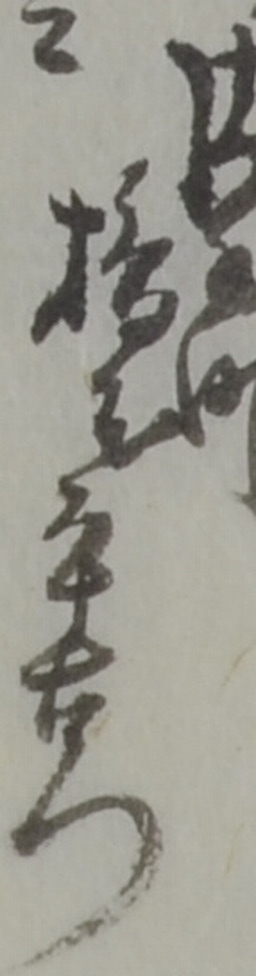願主平右衛門
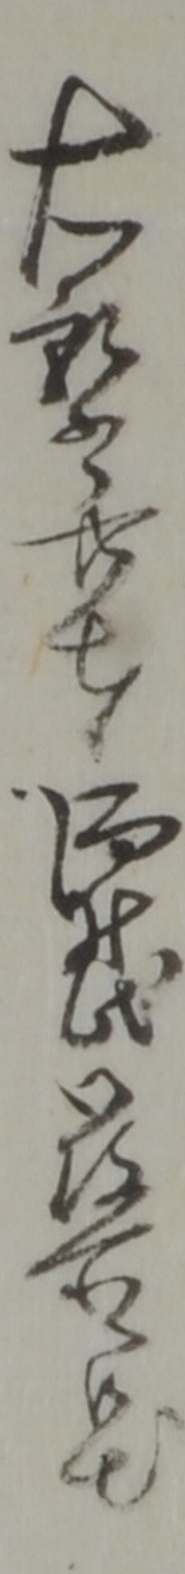右願書廿七日酒井氏御役所へ罷出
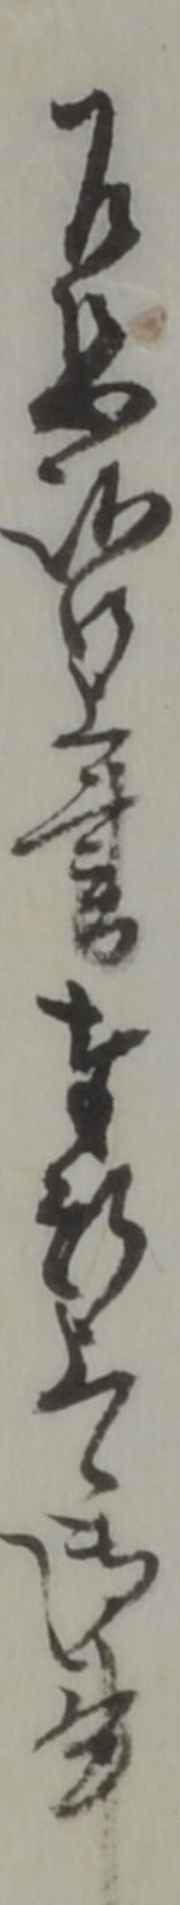乍恐以口上書奉願上候御事
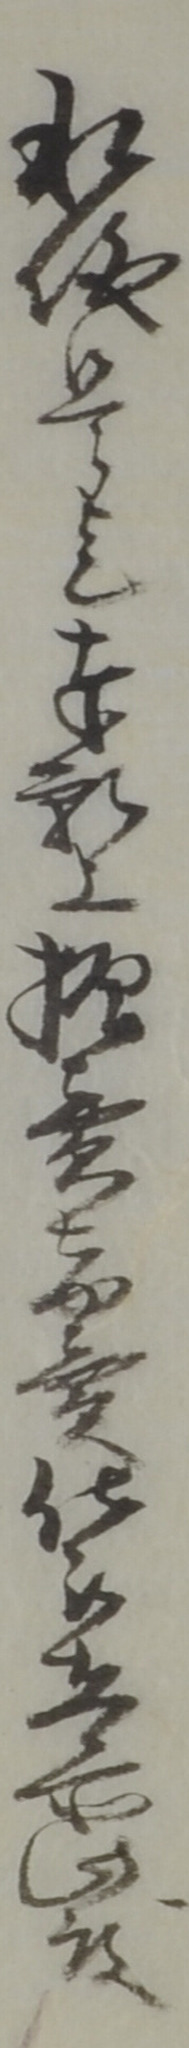私儀是迄奉願上振売商売仕罷在候所此度
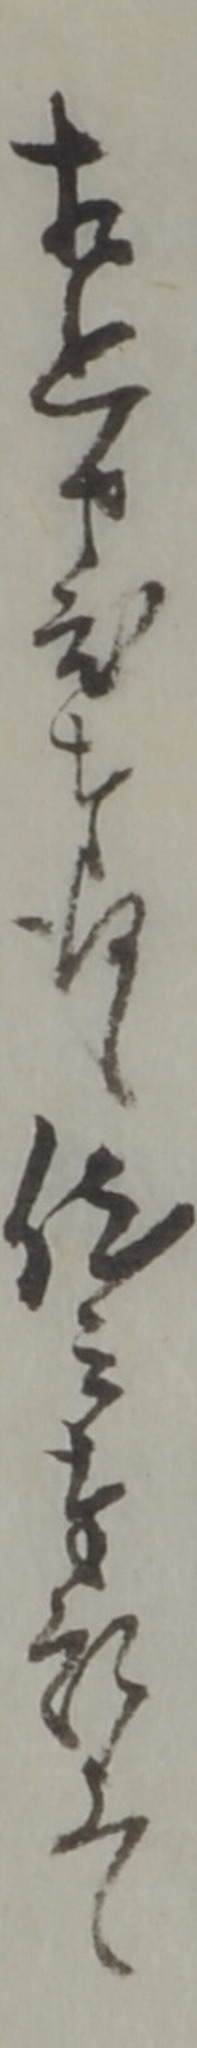相止申度奉存候依之奉願上候
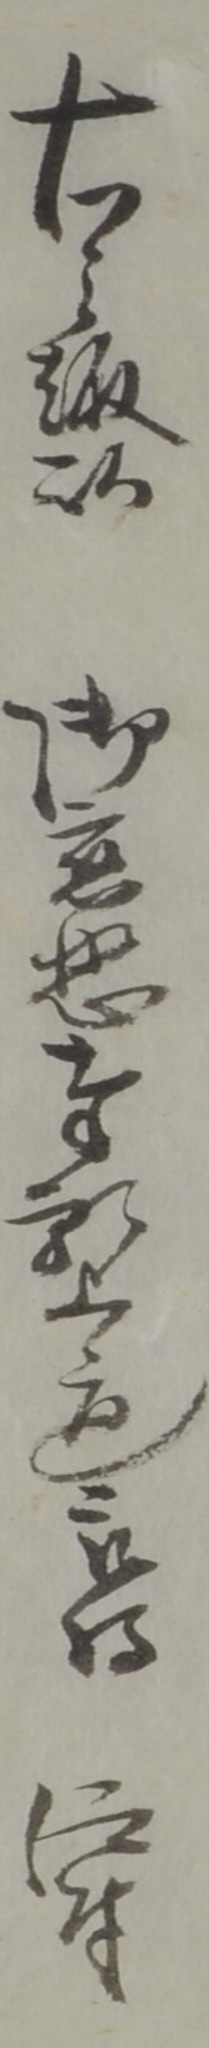右之趣以御慈悲奉願上候通被為仰付
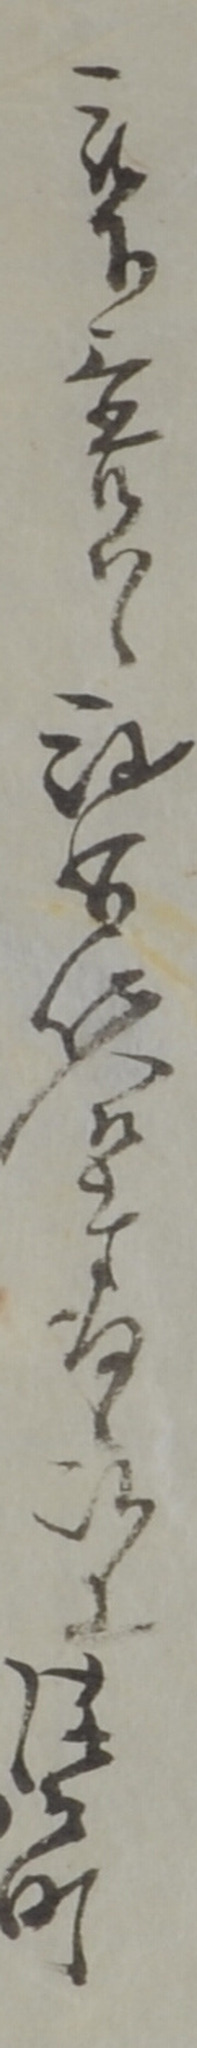被下置候ハヽ難有仕合奉存候以上清水町
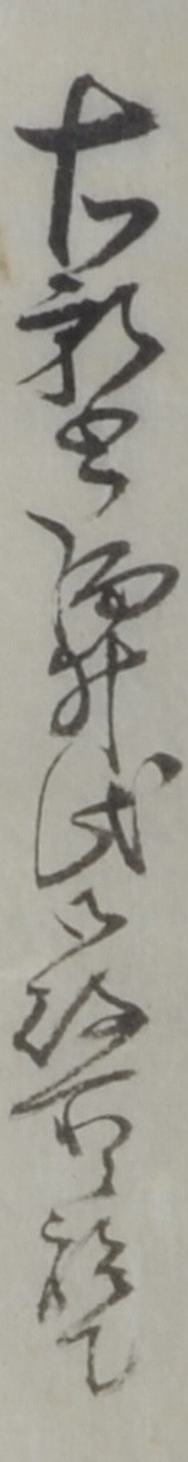右願書酒井氏御役所ニ於て
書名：諸願書控簿
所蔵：伊那市立高遠町図書館・合同会社AMANE
